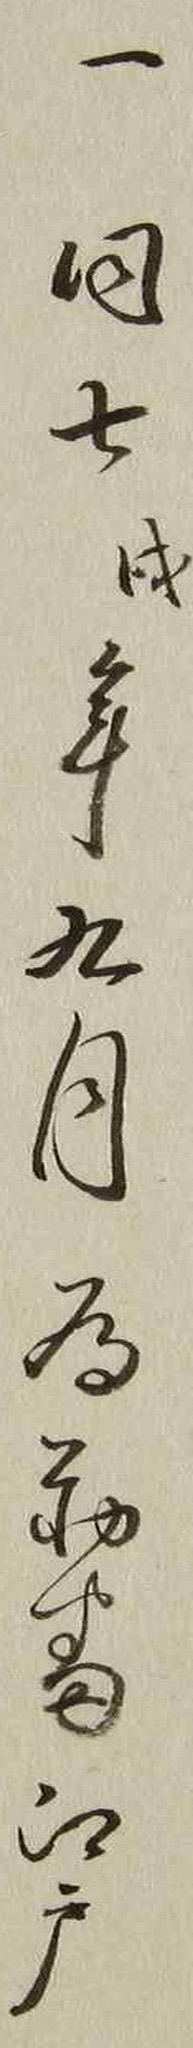一同七戌年九月為勤番江戸
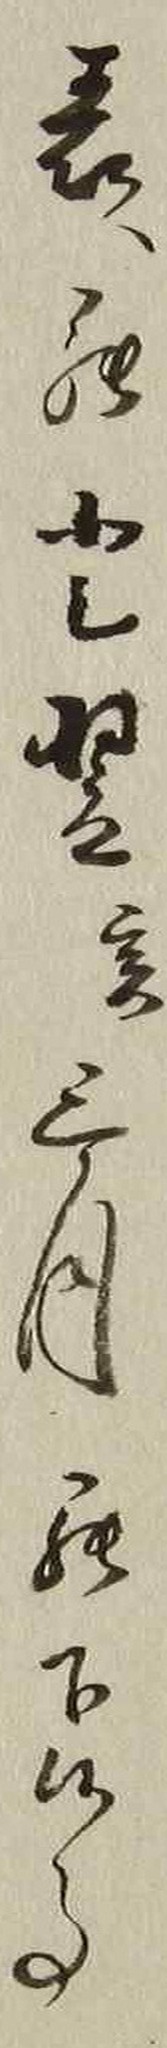表へ罷登翌亥三月罷下候事
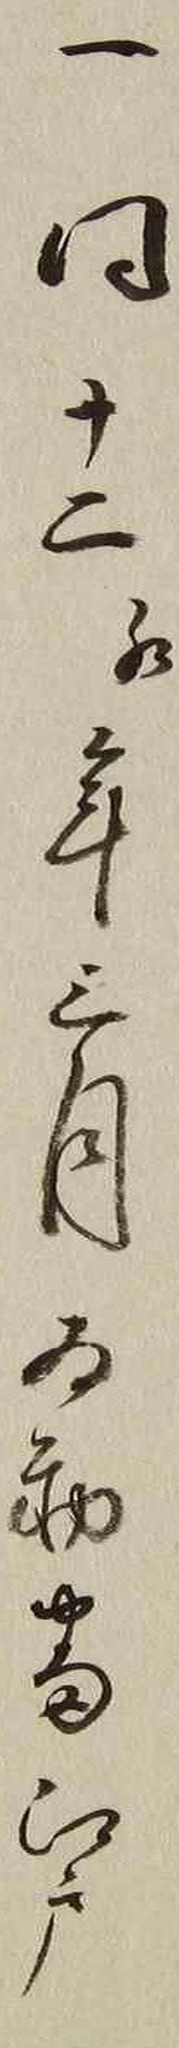一同十二卯年三月為勤番江戸
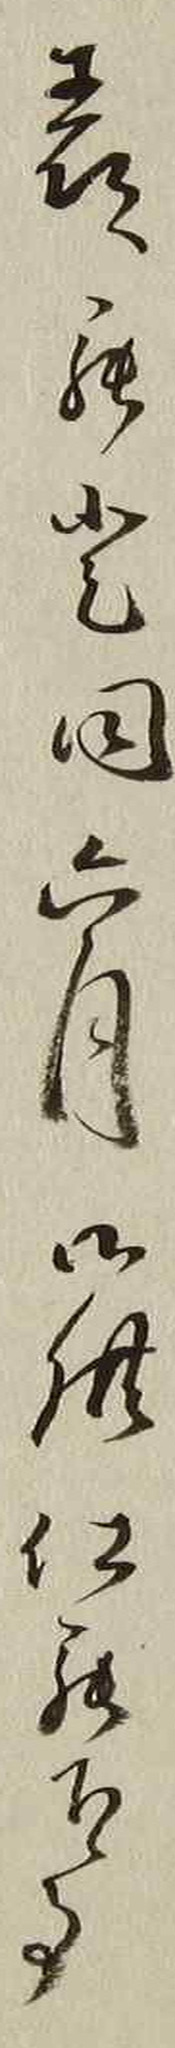表へ罷登同六月御供仕罷下候事
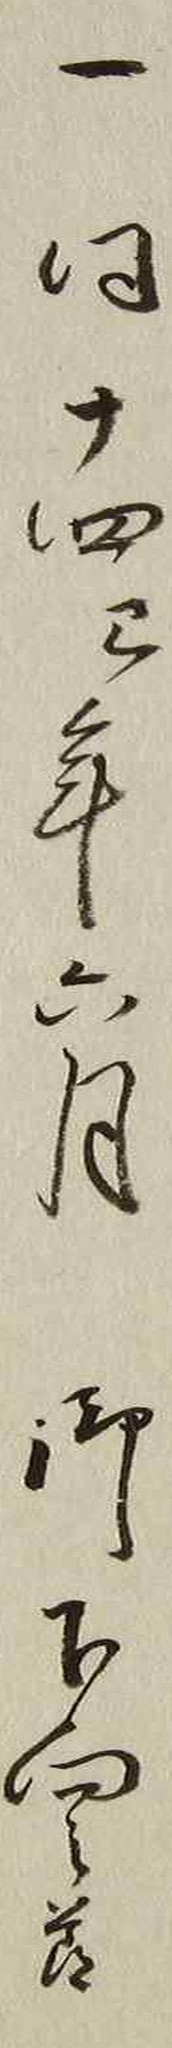一同十四巳年六月御下向之節
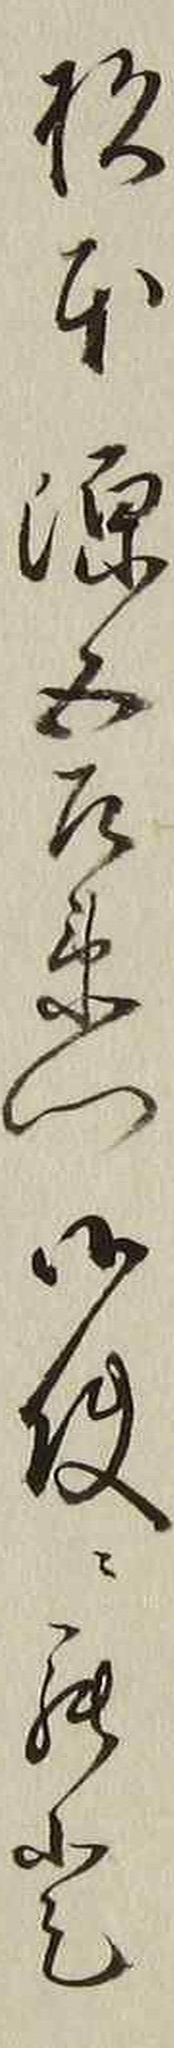杉本源五左衛門御使に罷登
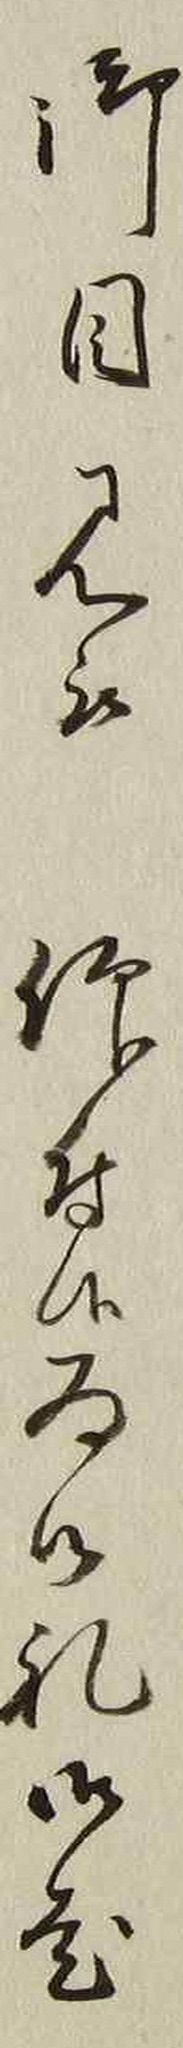御目見被仰付候為御礼御老
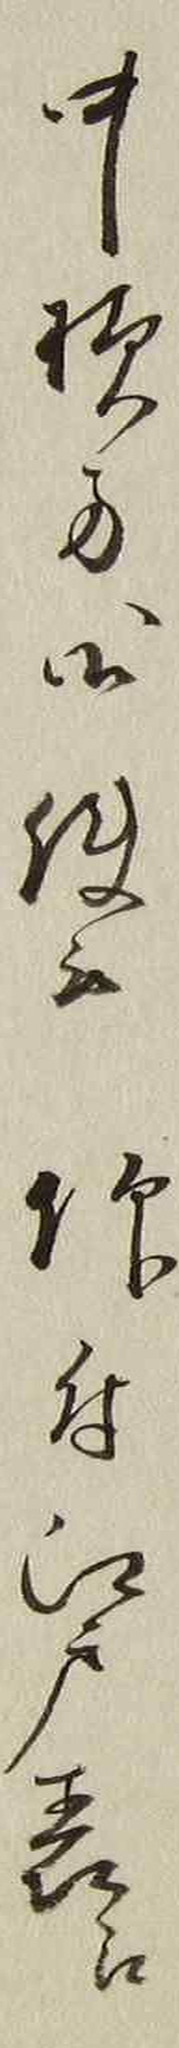中様方へ御使被仰付江戸表江
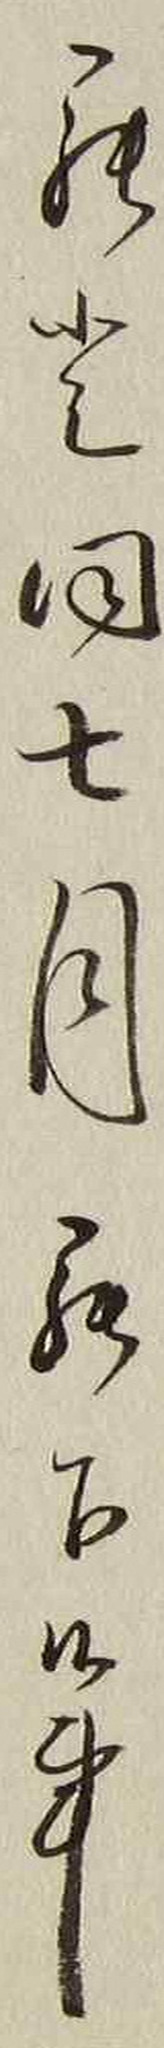罷登同七月罷下候事
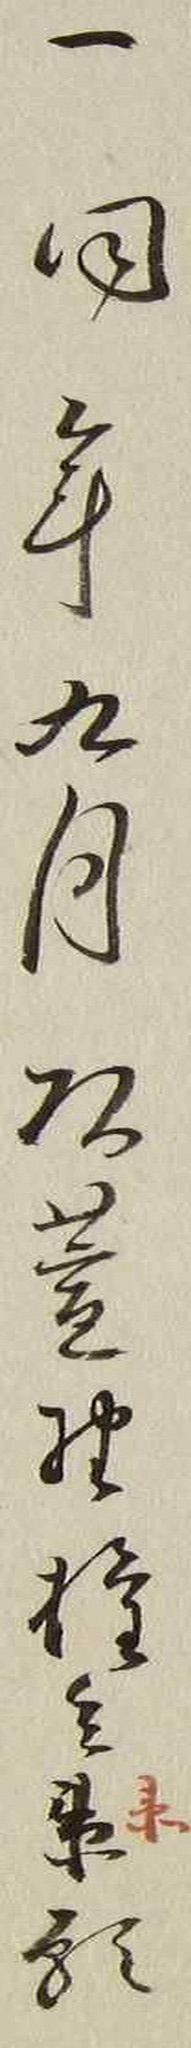一同年九月頭萱野権兵衛願
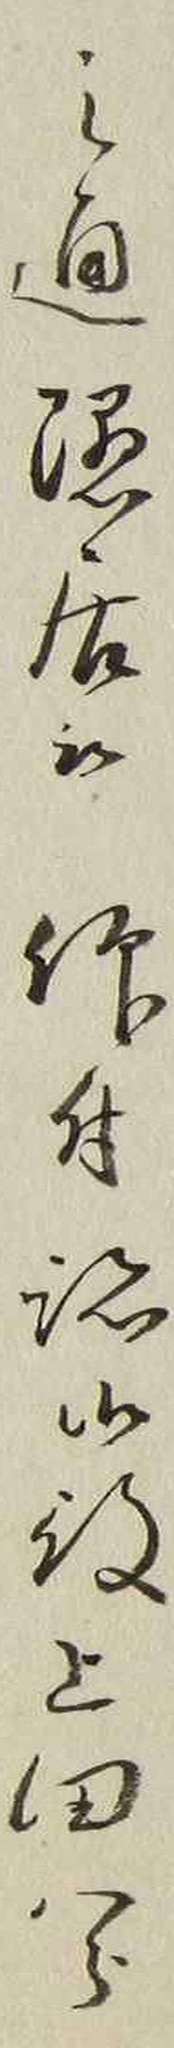之通隠居被仰付跡御役上田八郎
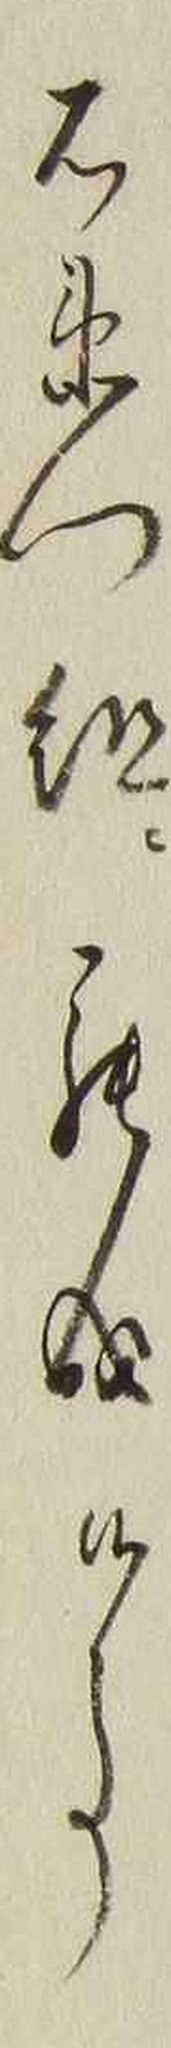右衛門組に罷成候事

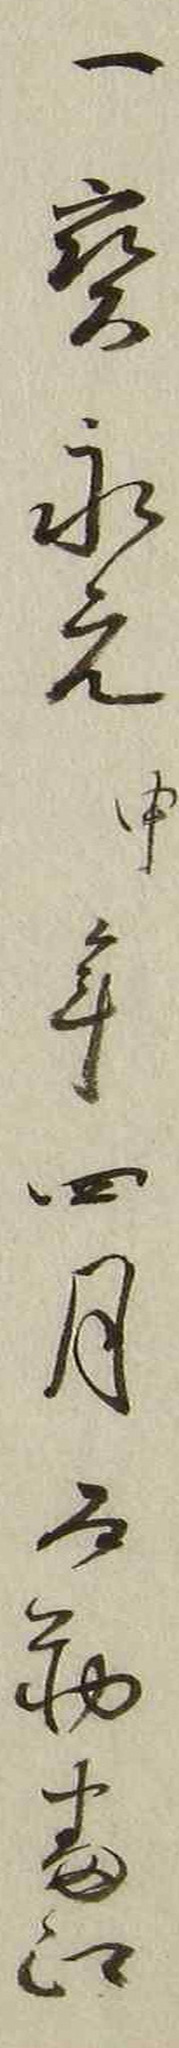一宝永元申年四月為勤番江
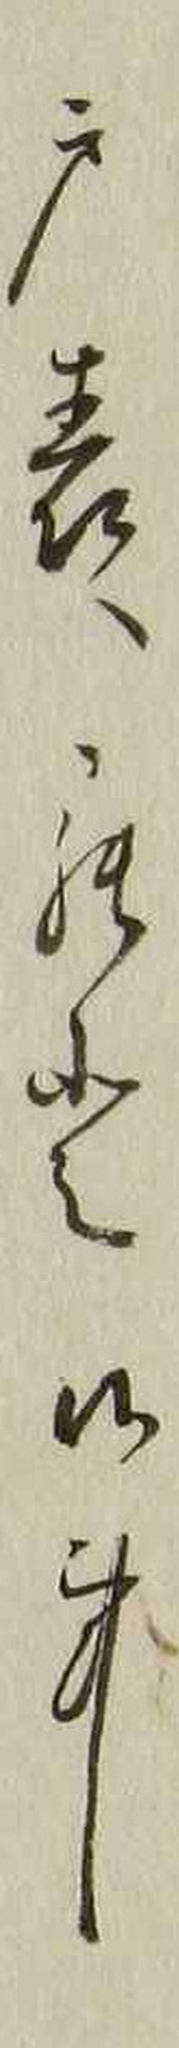戸表へ罷登候事
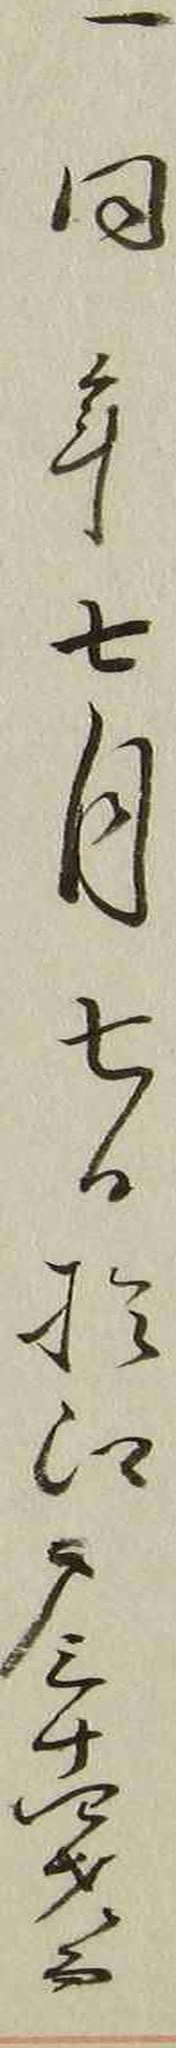一同年七月七日於江戸三十四才に而
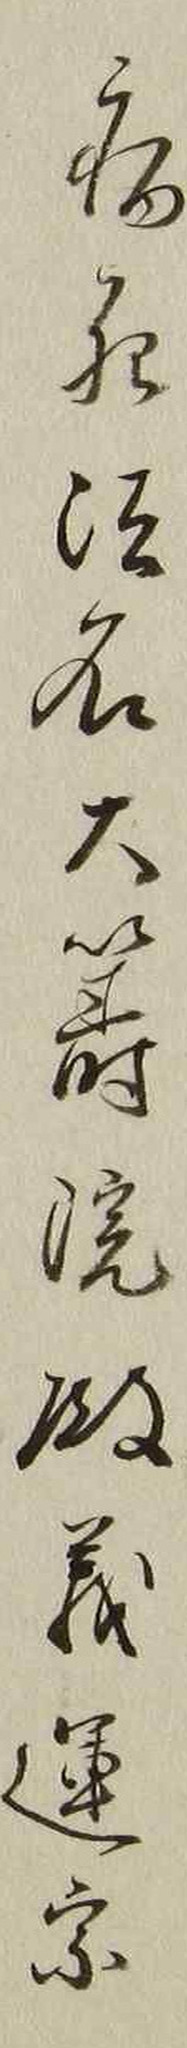病死法名大籌院殿義運宗
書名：諸士系譜　巻之159　な之部1
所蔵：会津若松市立会津図書館
